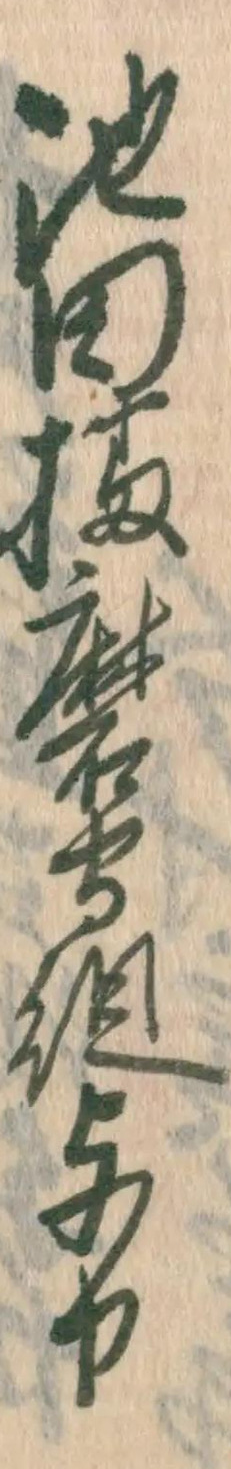池田播磨守組与力
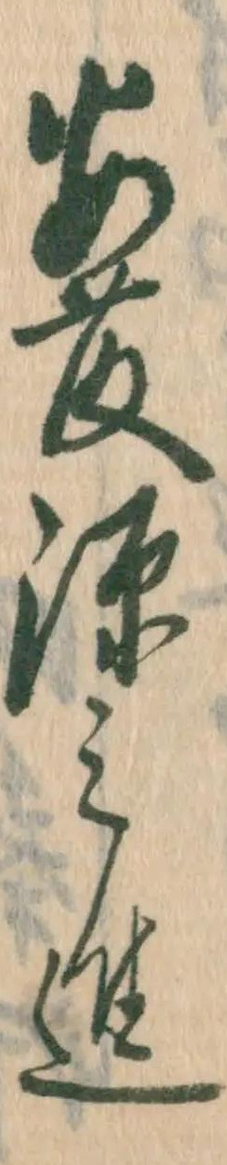安藤源之進
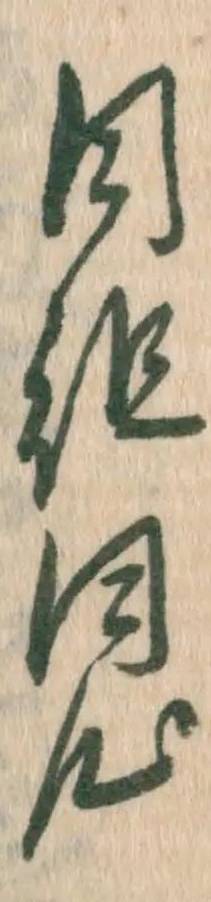同組同心
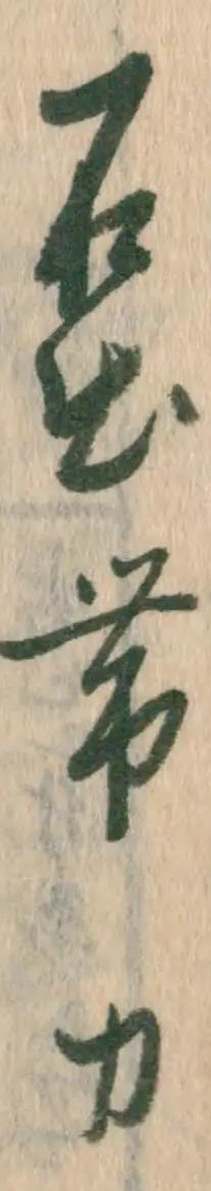石出帯刀
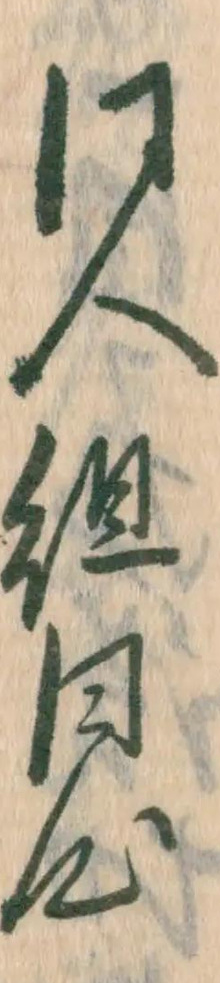同人組同心
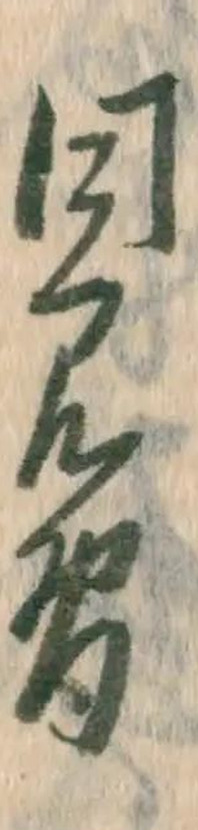同見習
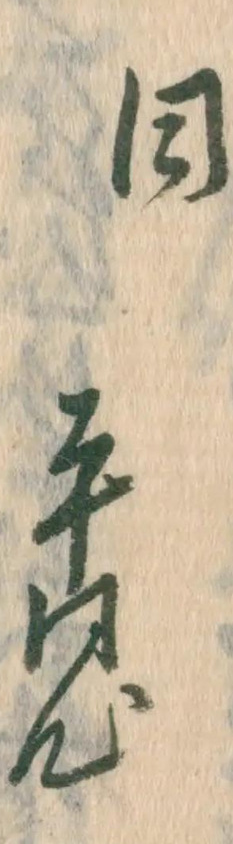同組同心
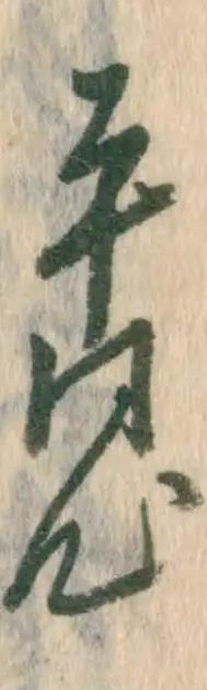平同心
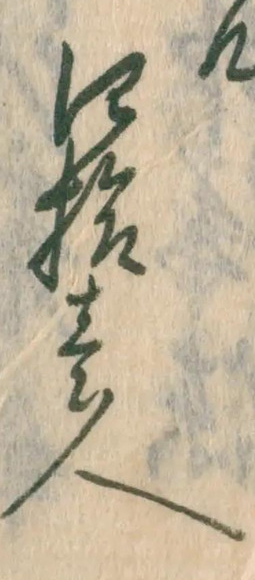四拾壱人

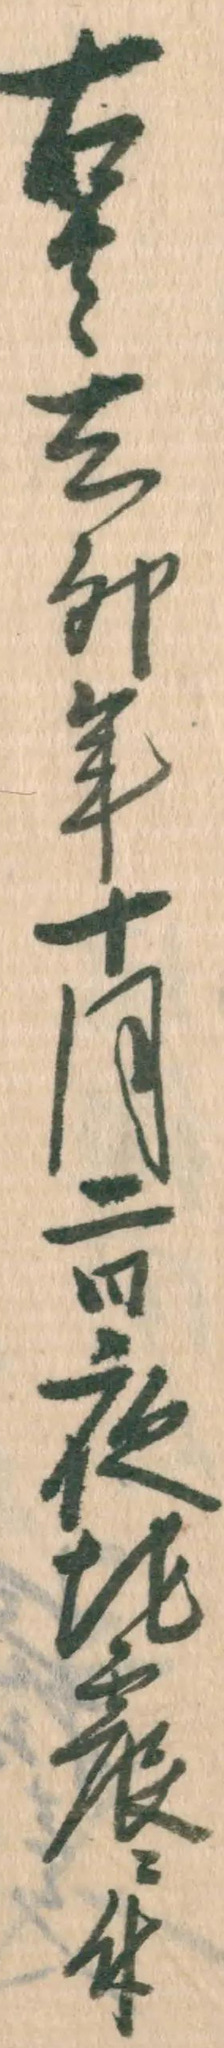右は去卯年十月二日夜地震ニ付
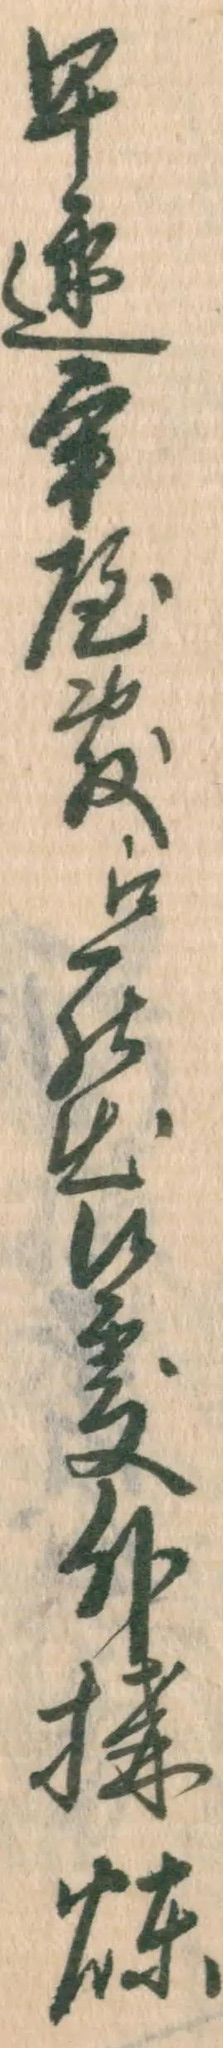早速牢屋敷え罷出候処外構煉
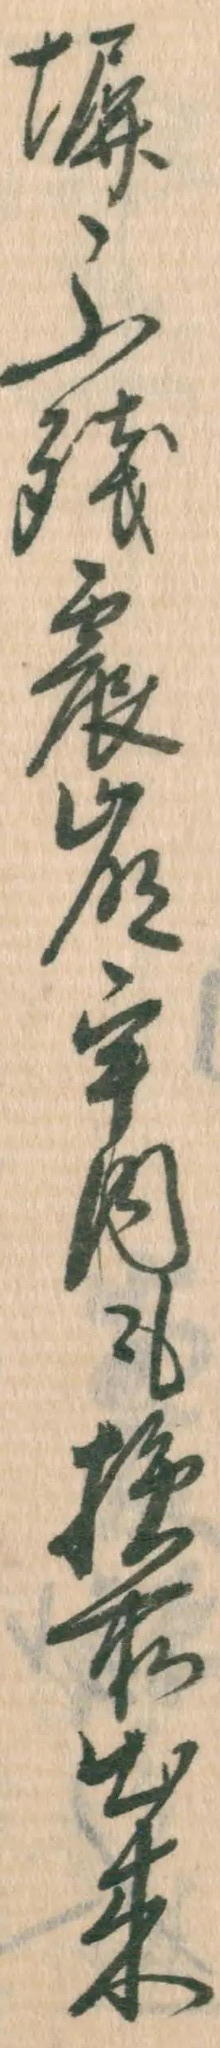塀不残震崩牢内も損所出来
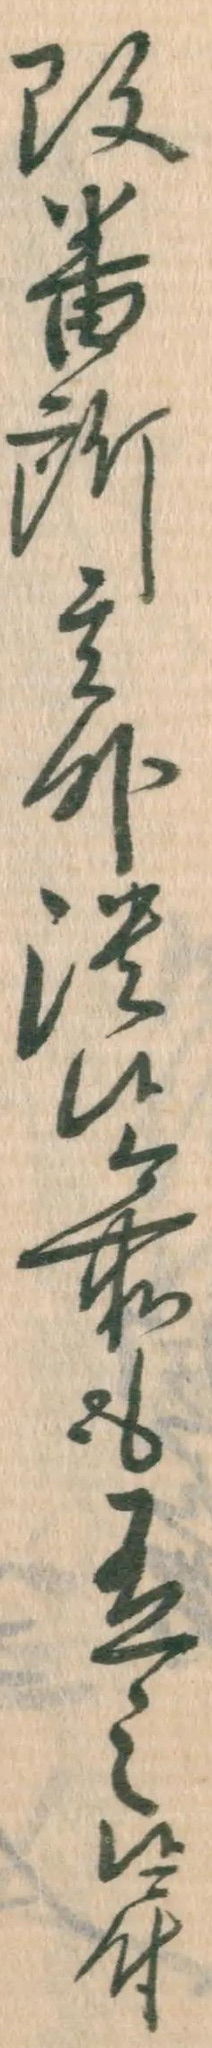改番所其外潰候ケ所も有之候ニ付
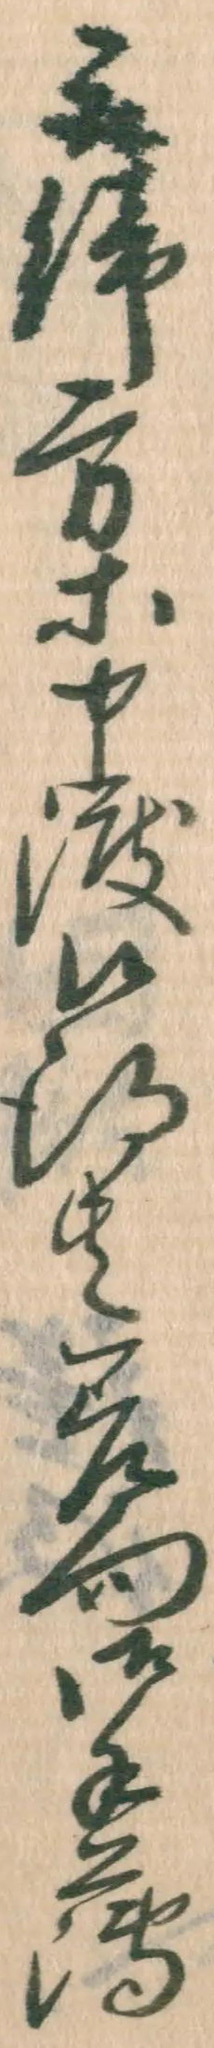取締方等申渡候得共差向御手薄
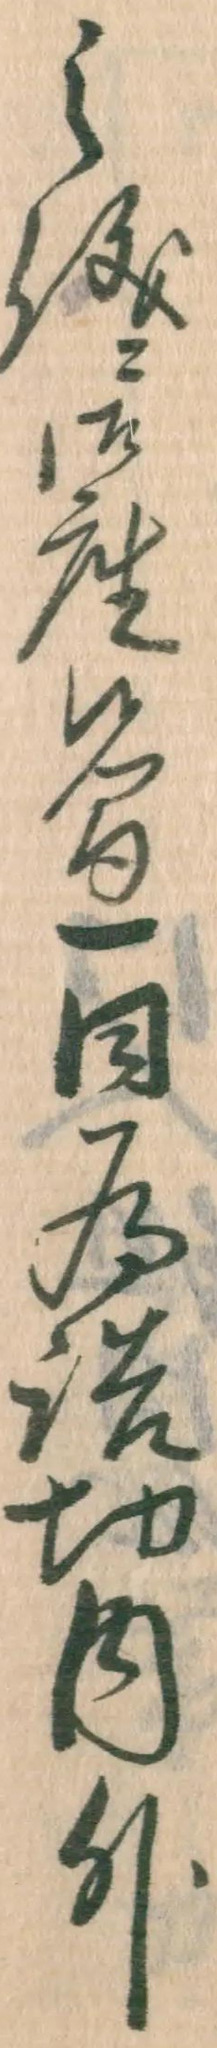之儀ニ御座候間一同為詰切内外
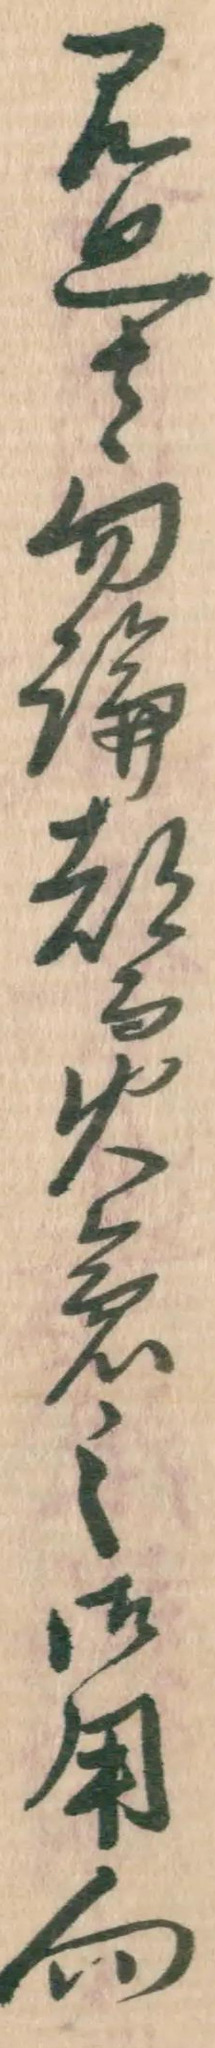見廻は勿論都て火急之御用向
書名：七十冊物類集 71巻. [44] 四十三 牢屋敷御普請御修覆地震ニ付骨折候牢屋掛御褒美之部
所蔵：国立国会図書館 National Diet Library, JAPAN
